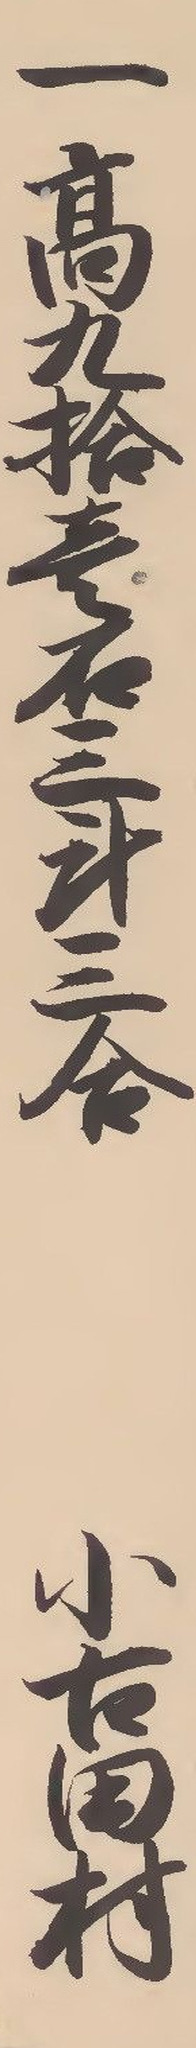一高九拾壱石三斗三合小古田村
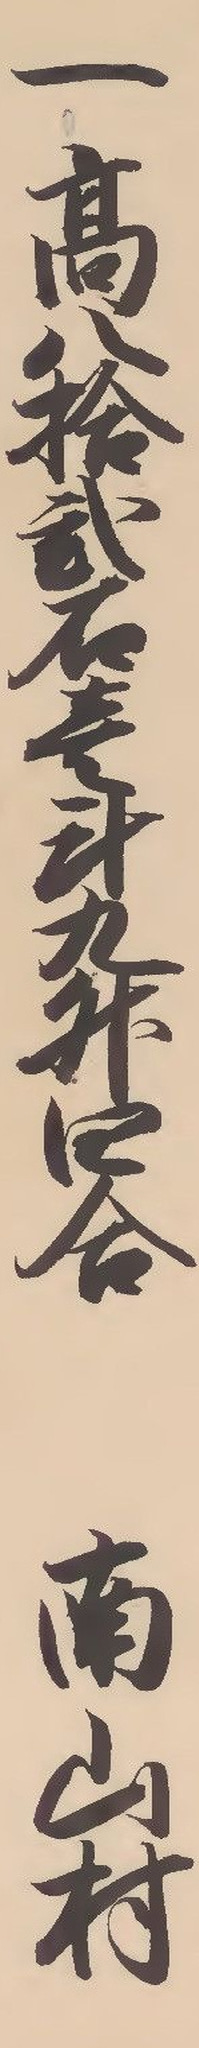一高八拾弐石壱斗九升四合南山村
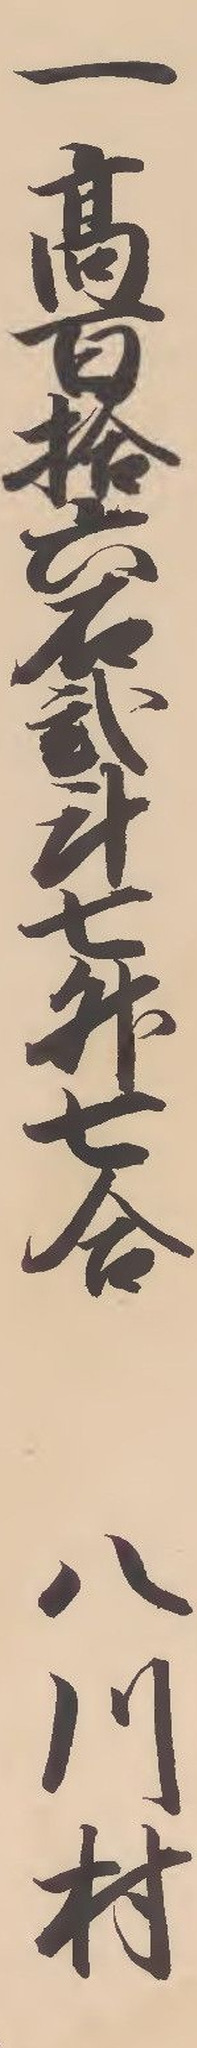一高百拾六石弐斗七升七合八川村
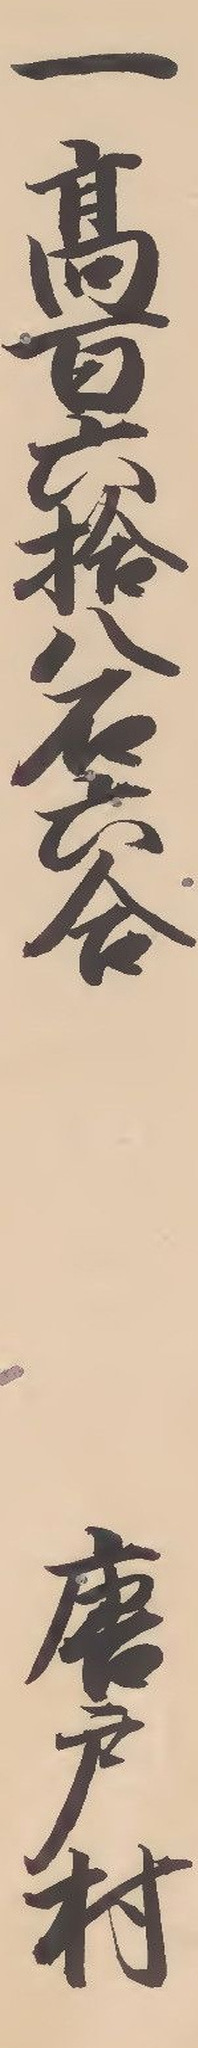一高百六拾八石六合唐戸村

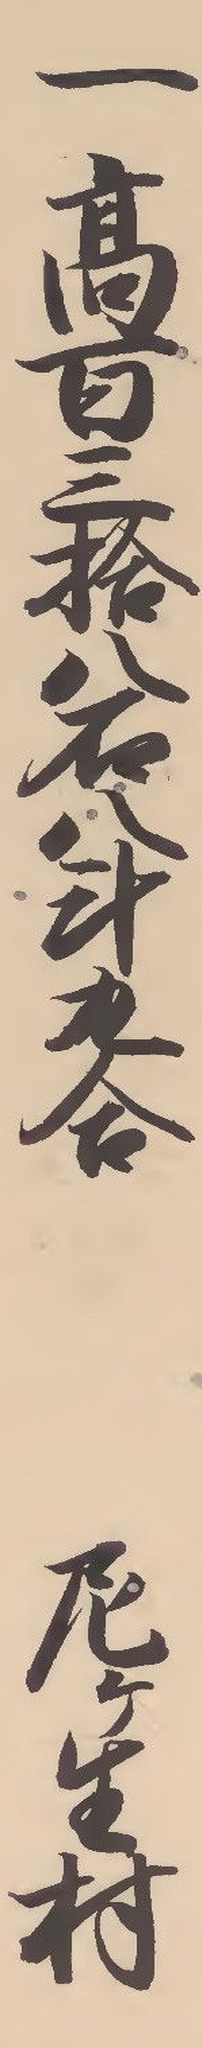一高百三拾八石八斗九合尼ヶ生村
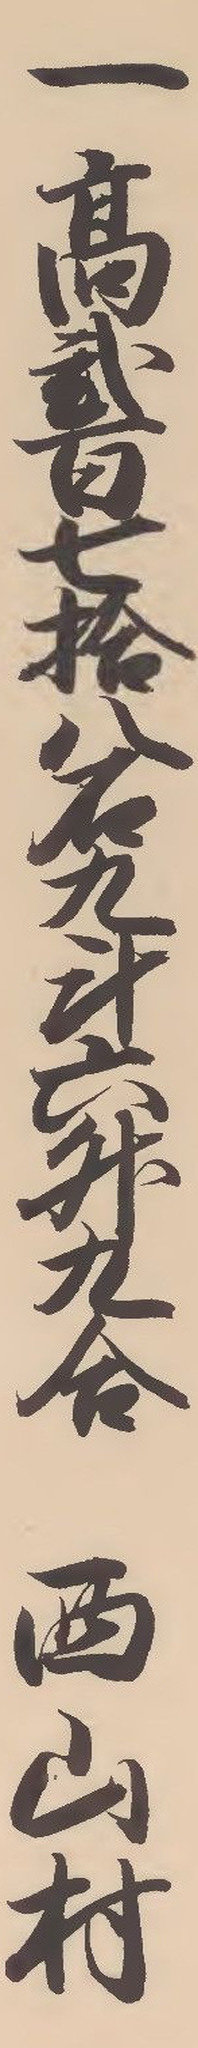一高弐百七拾八石九斗六升九合西山村
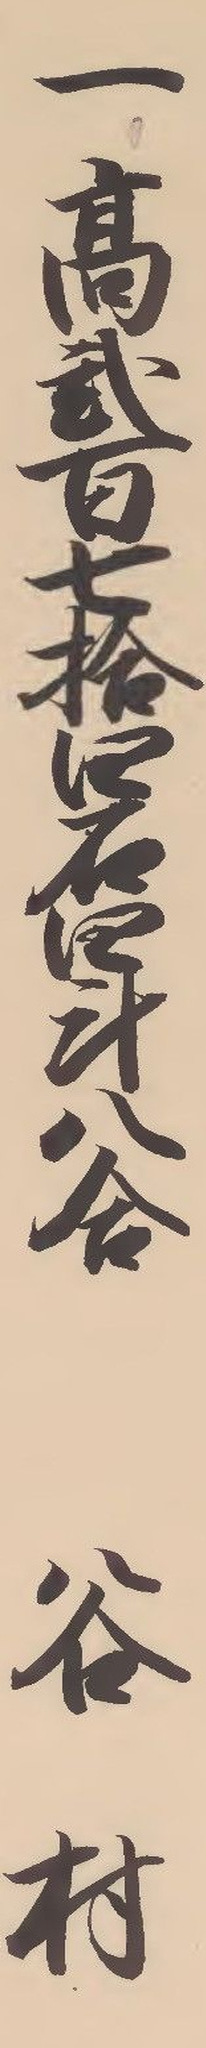一高弐百七拾四石四斗八合谷村
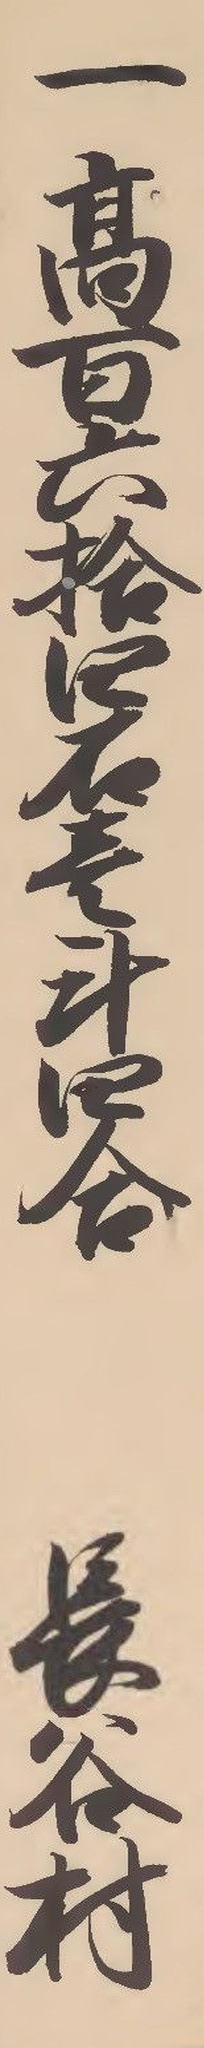一高百六拾四石壱斗四合長谷村
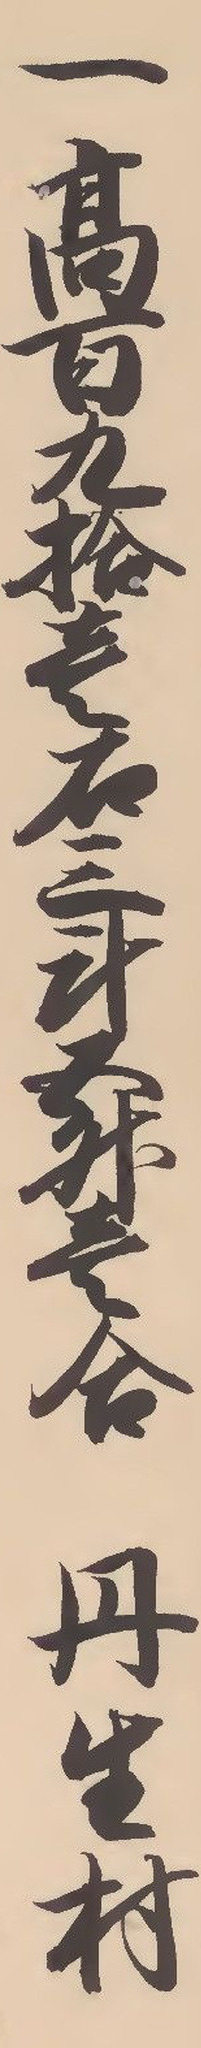一高百九拾壱石三斗五升壱合丹生村
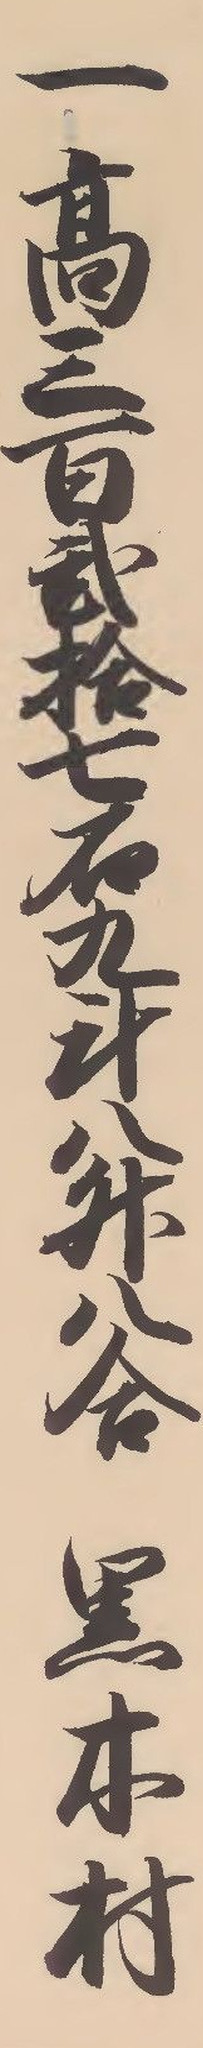一高三百弐拾七石九斗八升八合黒木村
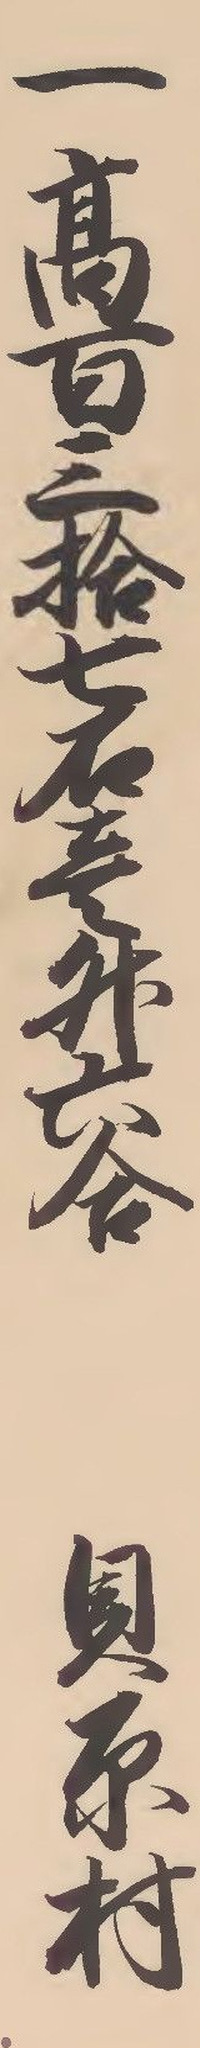一高百三拾七石壱升六合貝原村
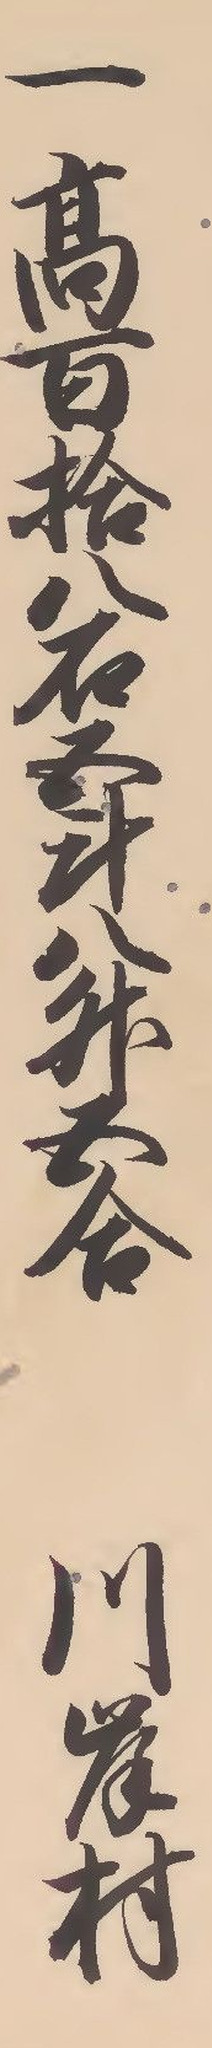一高百拾八石五斗八升五合川岸村

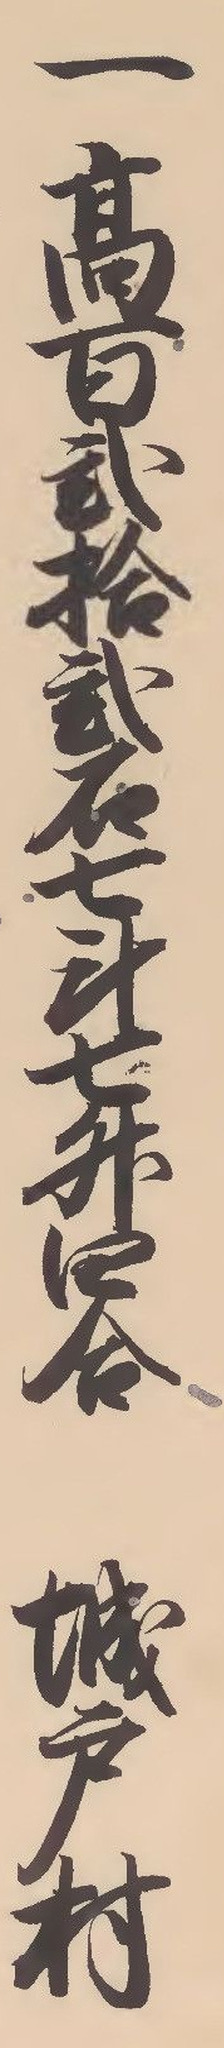一高百弐拾弐石七斗七升四合城戸村
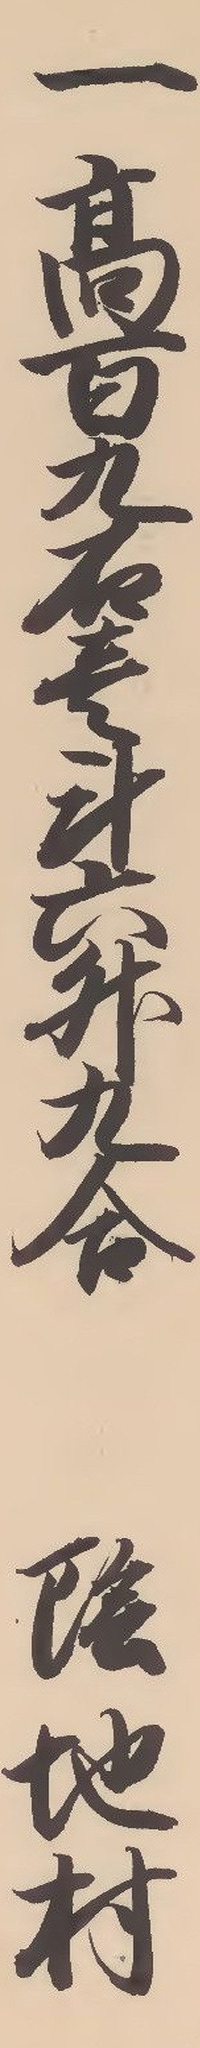一高百九石壱斗六升九合陰地村
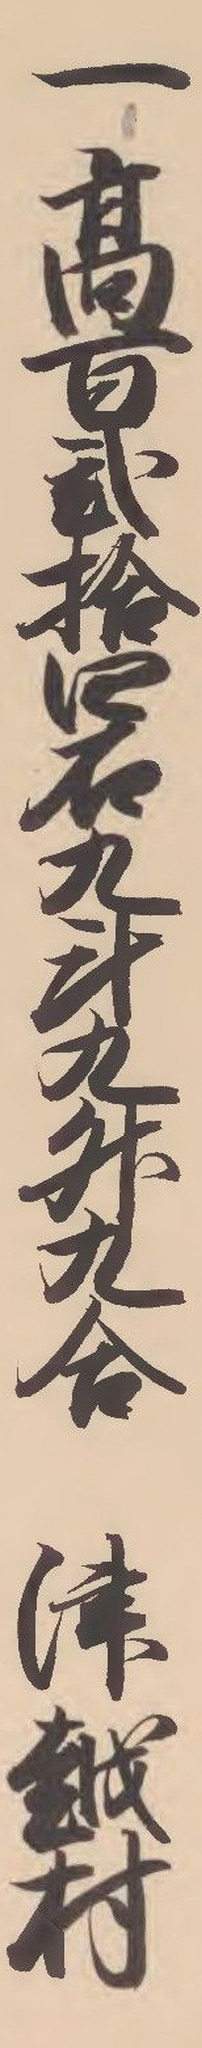一高百弐拾四石九斗九升九合津越村
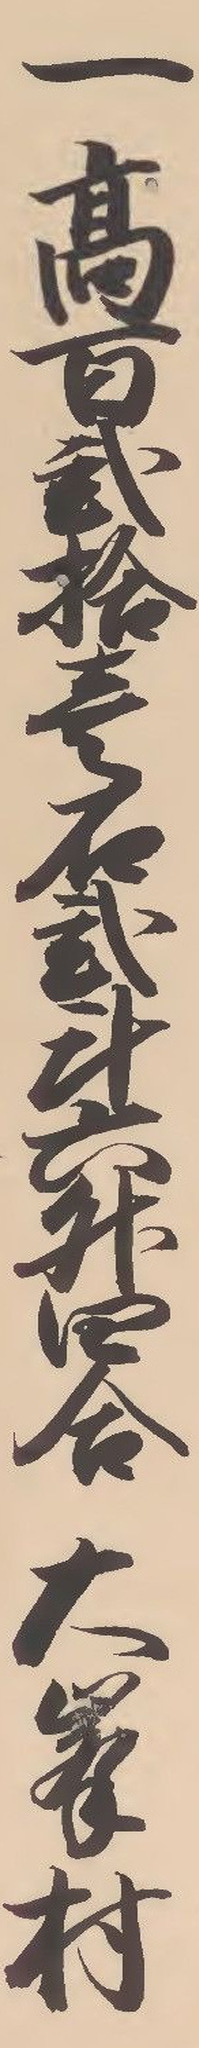一高百弐拾壱石弐斗六升四合大峯村
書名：大和国郷帳
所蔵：国立公文書館 National Archives of Japan
